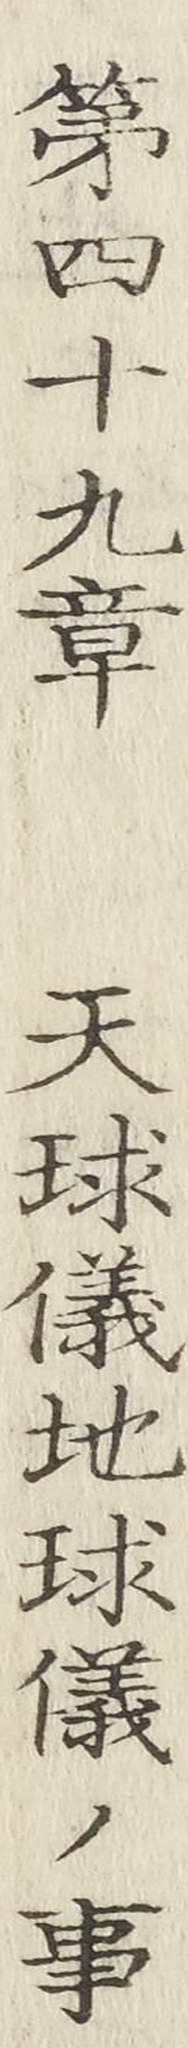第四十九章天球儀地球儀ノ事
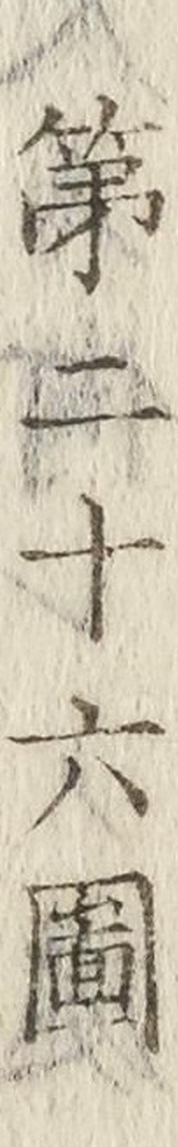第二十六図
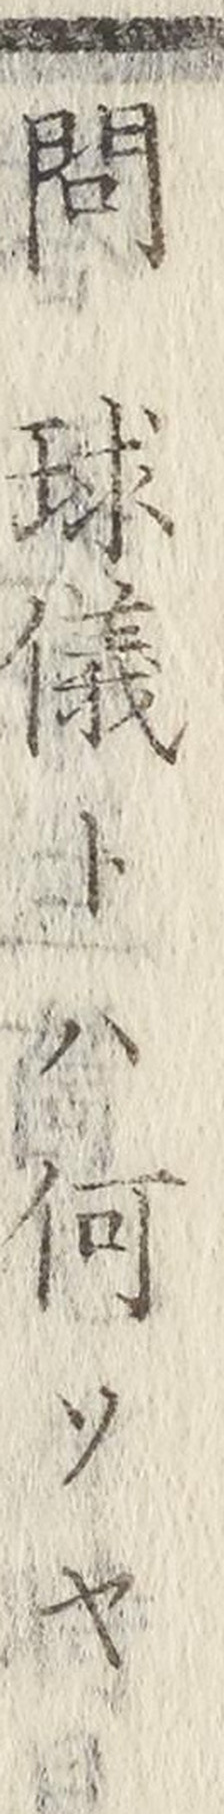問球儀トハ何ソヤ
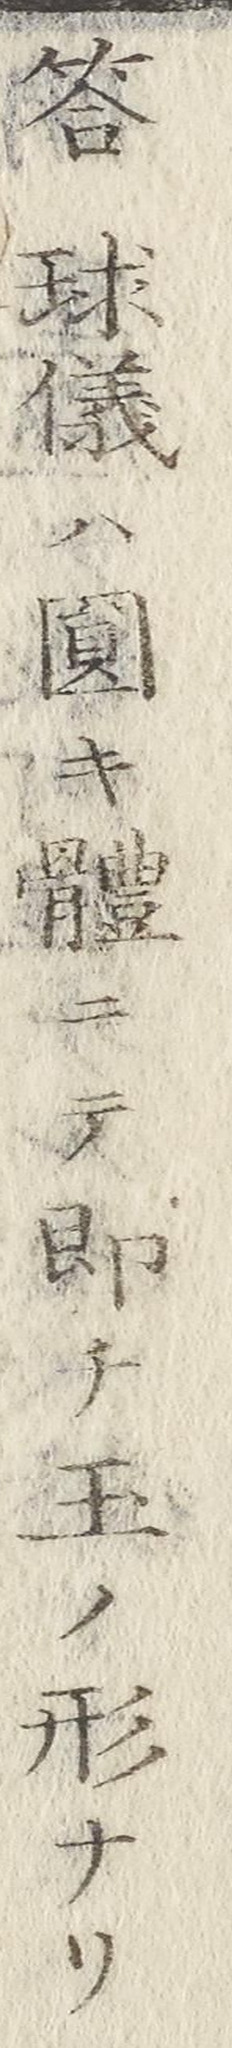答球儀ハ円キ体ニテ即チ玉ノ形ナリ
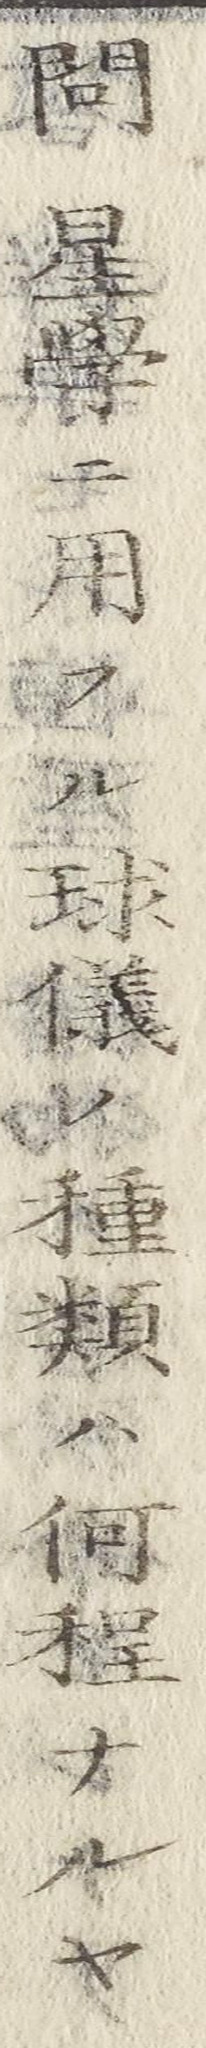問星学ニ用フル球儀ノ種類ハ何程ナルヤ
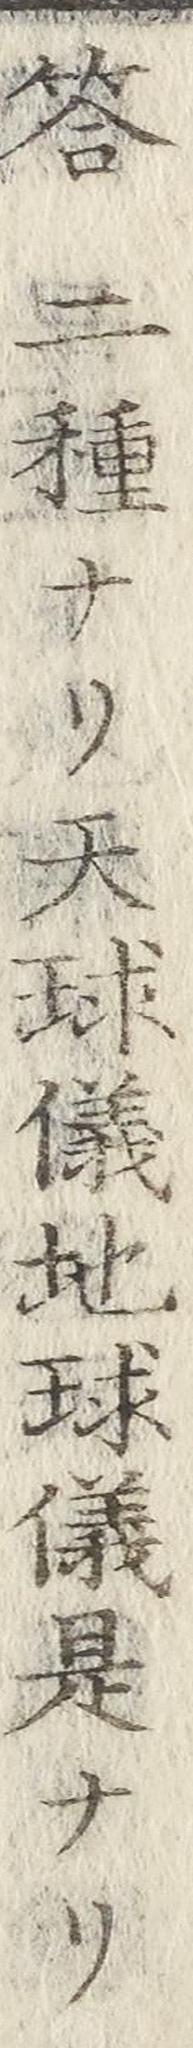答二種ナリ天球儀地球儀是ナリ
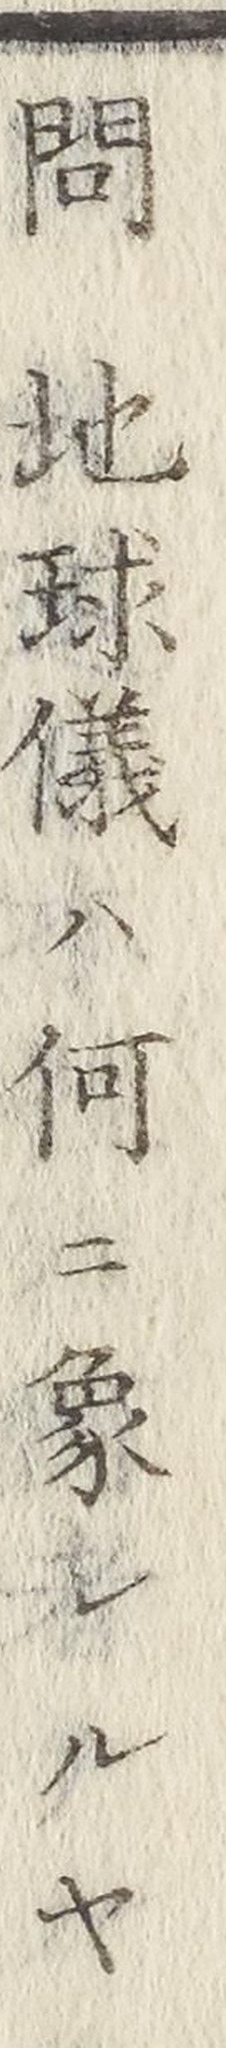問地球儀ハ何ニ象レルヤ
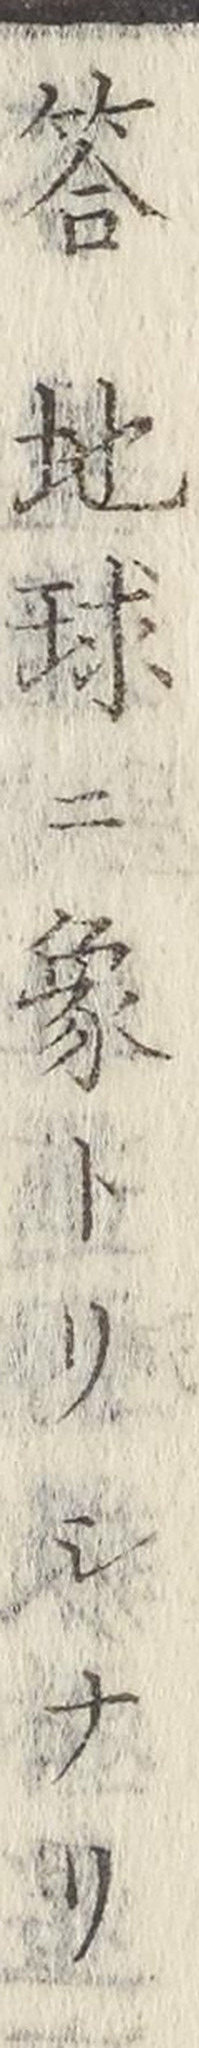答地球ニ象トリシナリ
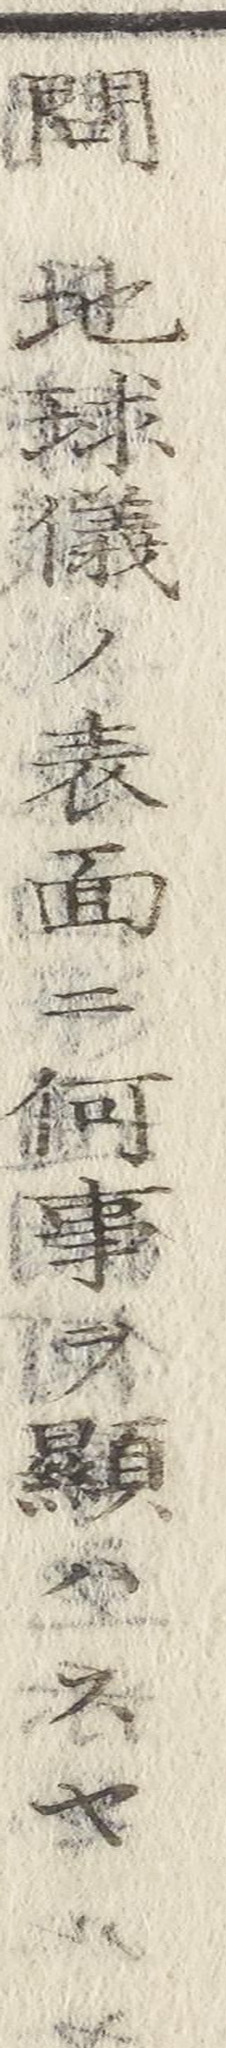問地球儀ノ表面ニ何事ヲ顕ハスヤ
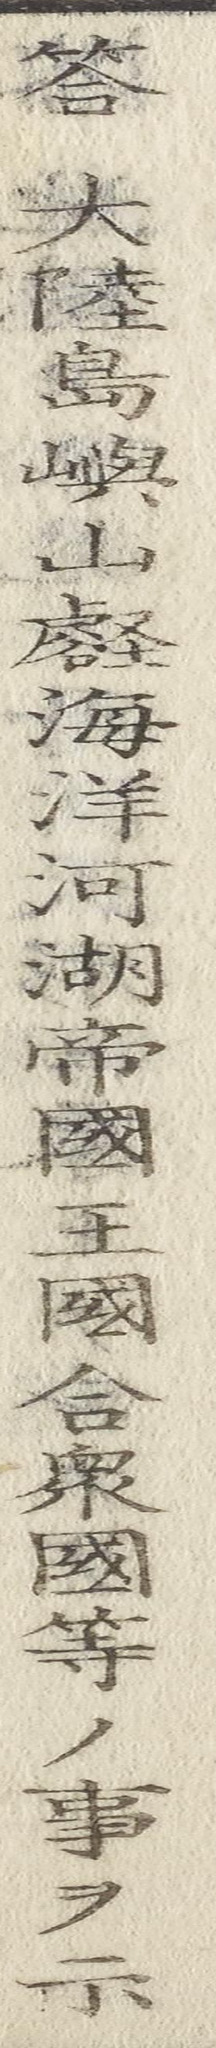答大陸島嶼山叡海洋河湖帝国王国合衆国等ノ事ヲ示

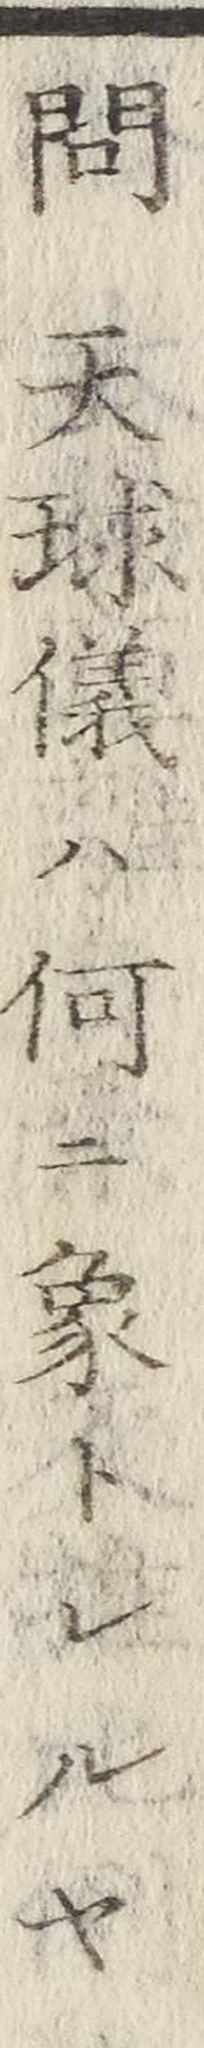問天球儀ハ何ニ象トレルヤ
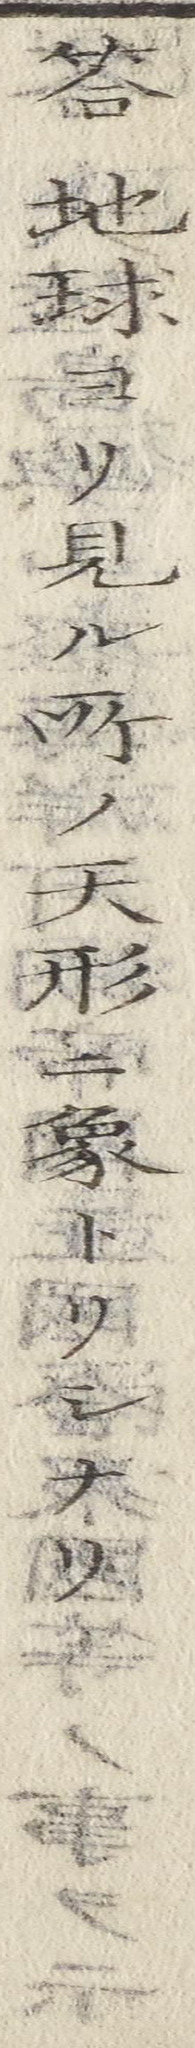答地球ヨリ見ル所ノ天形ニ象トリシナリ
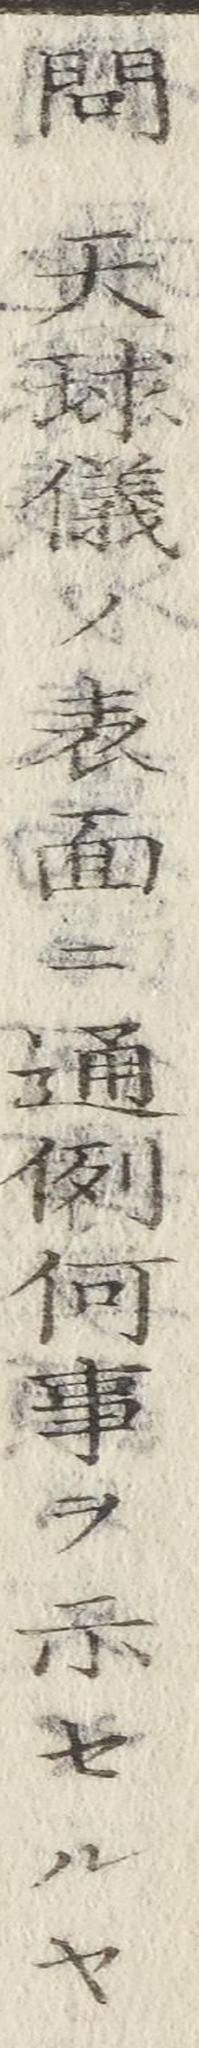問天球儀ノ表面ニ通例何事ヲ示セルヤ
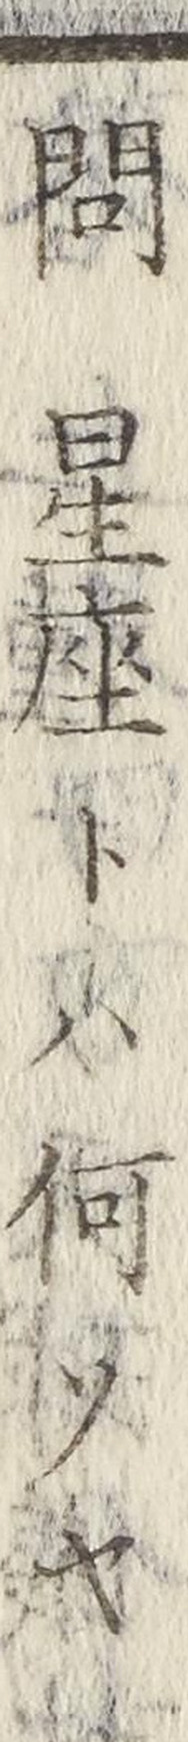問星座トハ何ソヤ
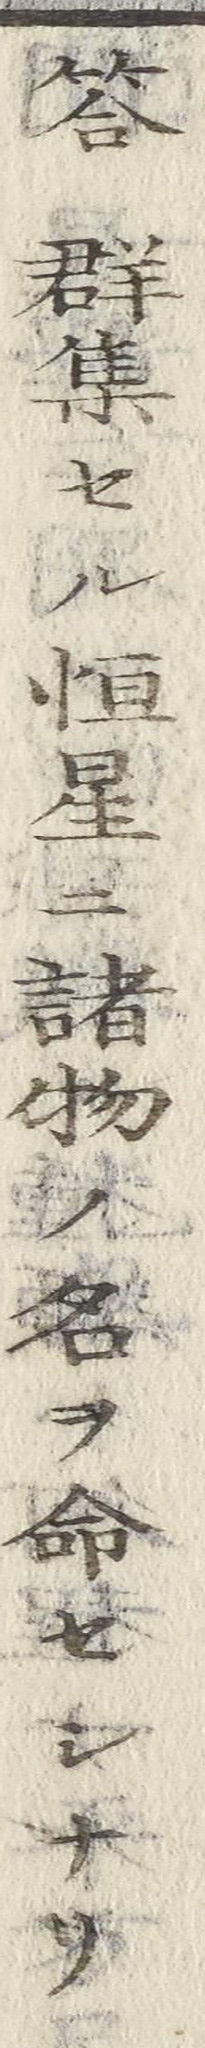答群集セル恒星ニ諸物ノ名ヲ命セシナリ
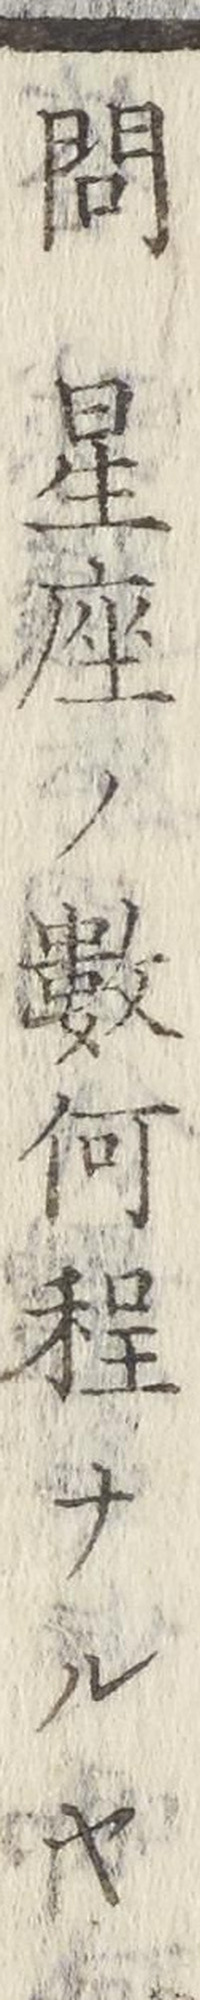問星座ノ数何程ナルヤ
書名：星学圖説　下
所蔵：東京大学地震研究所図書室 Earthquake Research Institute Library, The University of Tokyo, JAPAN
